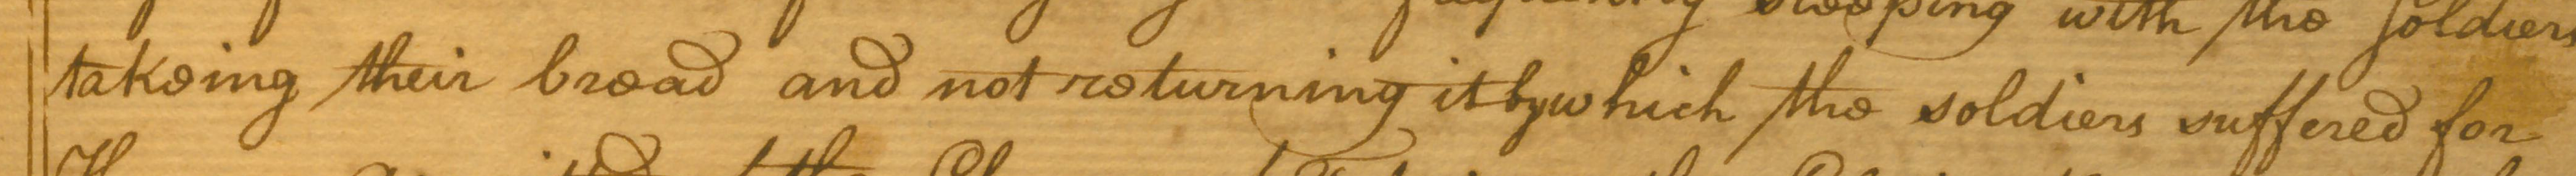takeing their bread and not returning it by which the soldiers suffered for
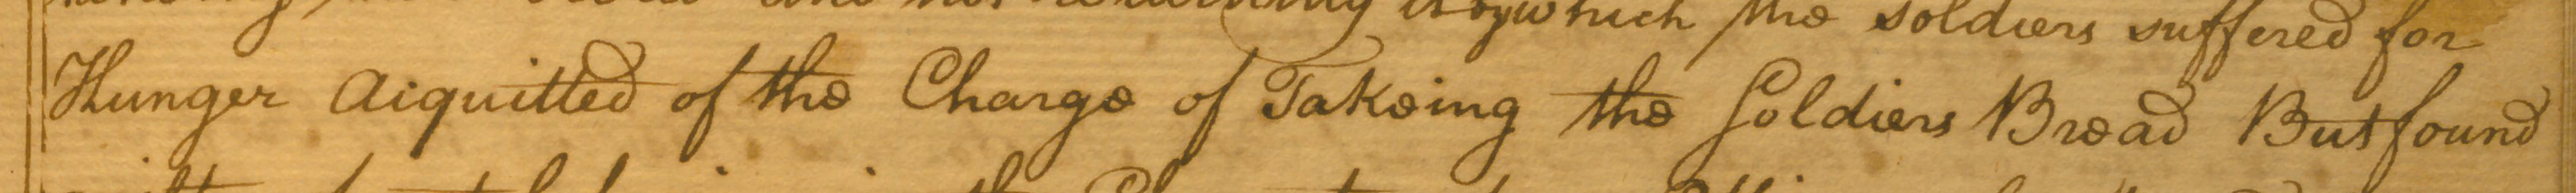Hunger acquitted of the Charge of Takeing the soldiers Bread But found
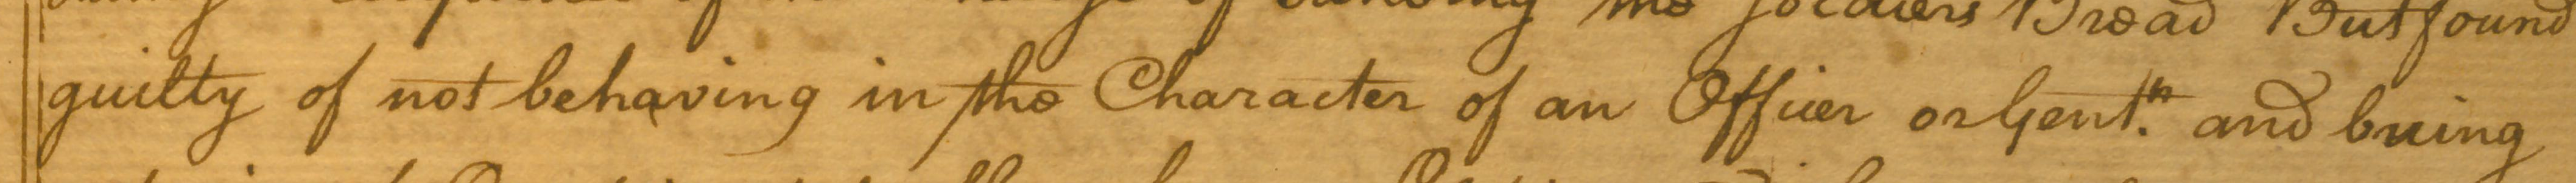guilty of not behaving in the Character of an Officer or Gent^n. and buing
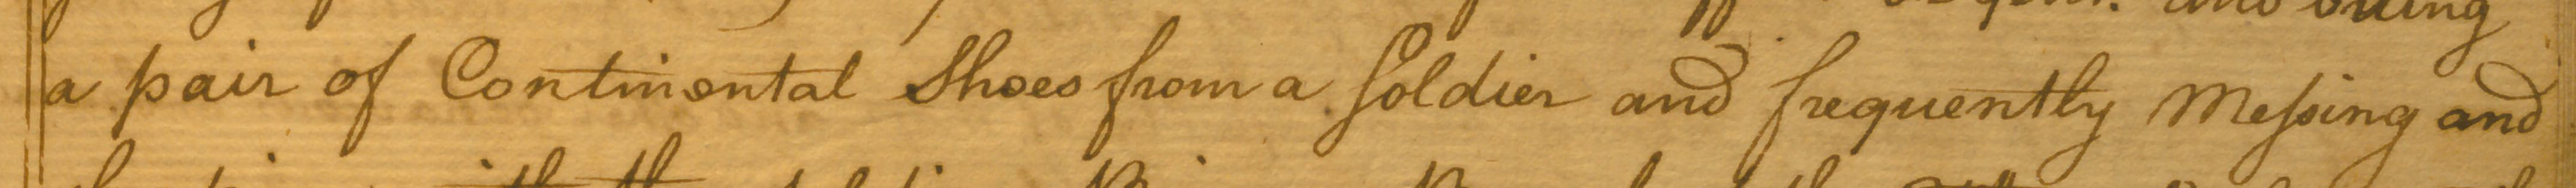a pair of Continental Shoes from a soldier and frequently messing and
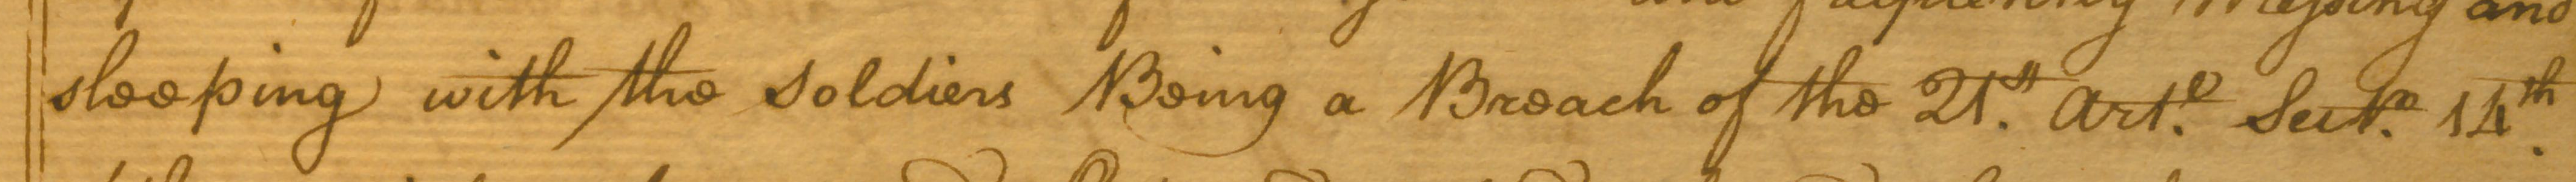sleeping with the soldiers Being a Breach of the 21^st. Art^l. Sect^n. 14^th.
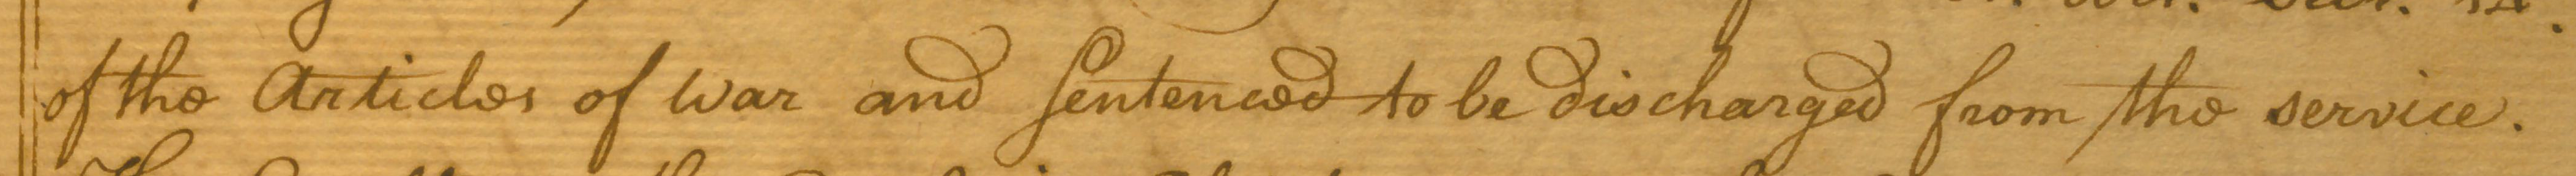of the Articles of war and sentenced to be discharged from the service.
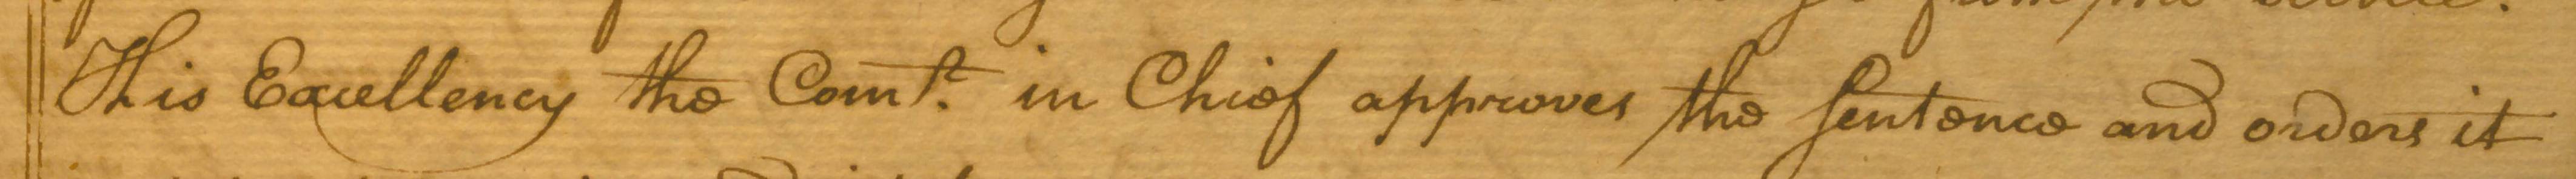His Excellency the Com^r. in Chief approves the sentence and orders it
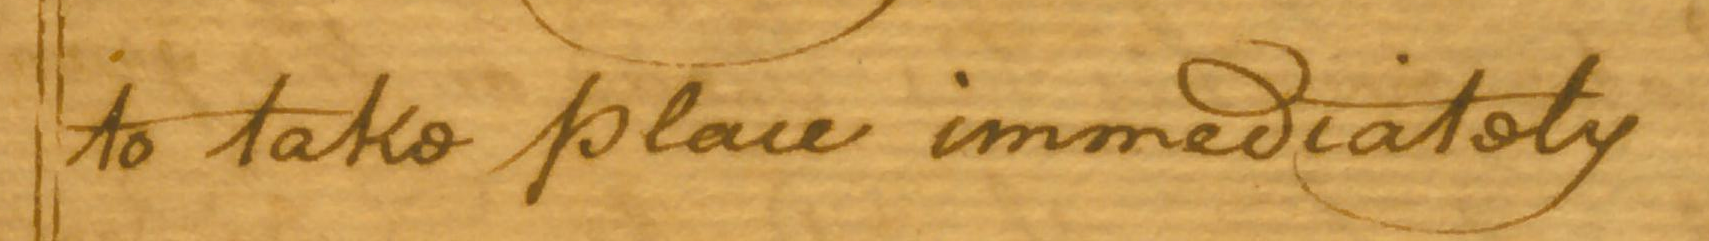to take place immediately
